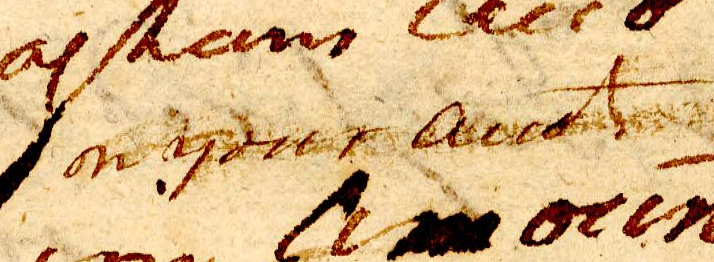on your Acco^t.
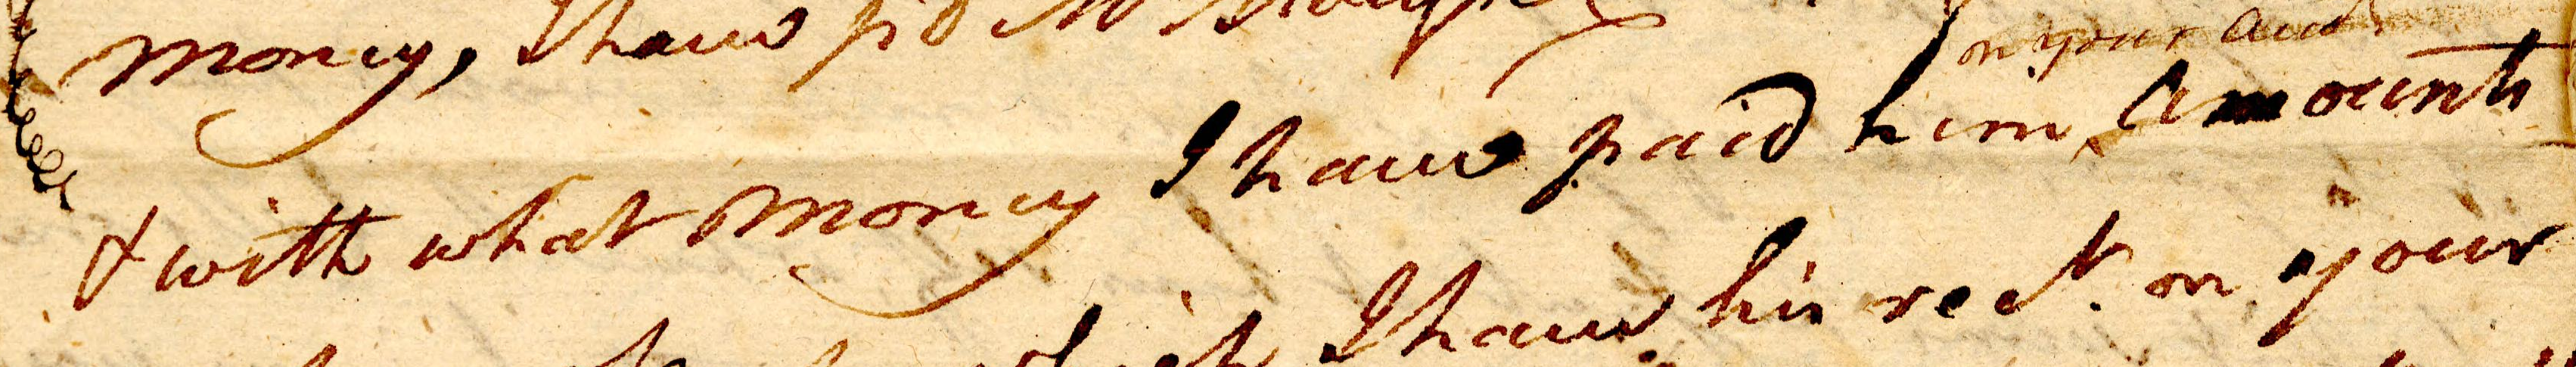& with what money I have paid him ^ Amounts
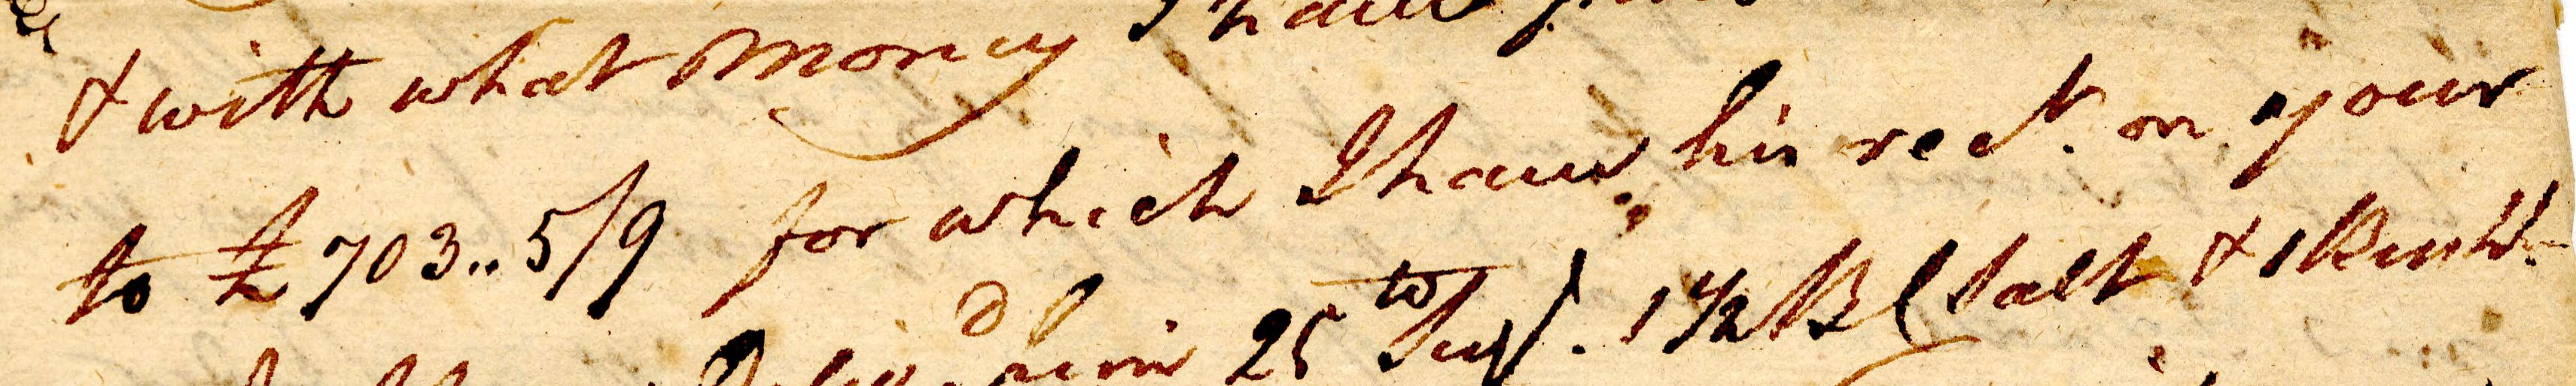to £703.. 5s9 for which I have his rec^t. in your
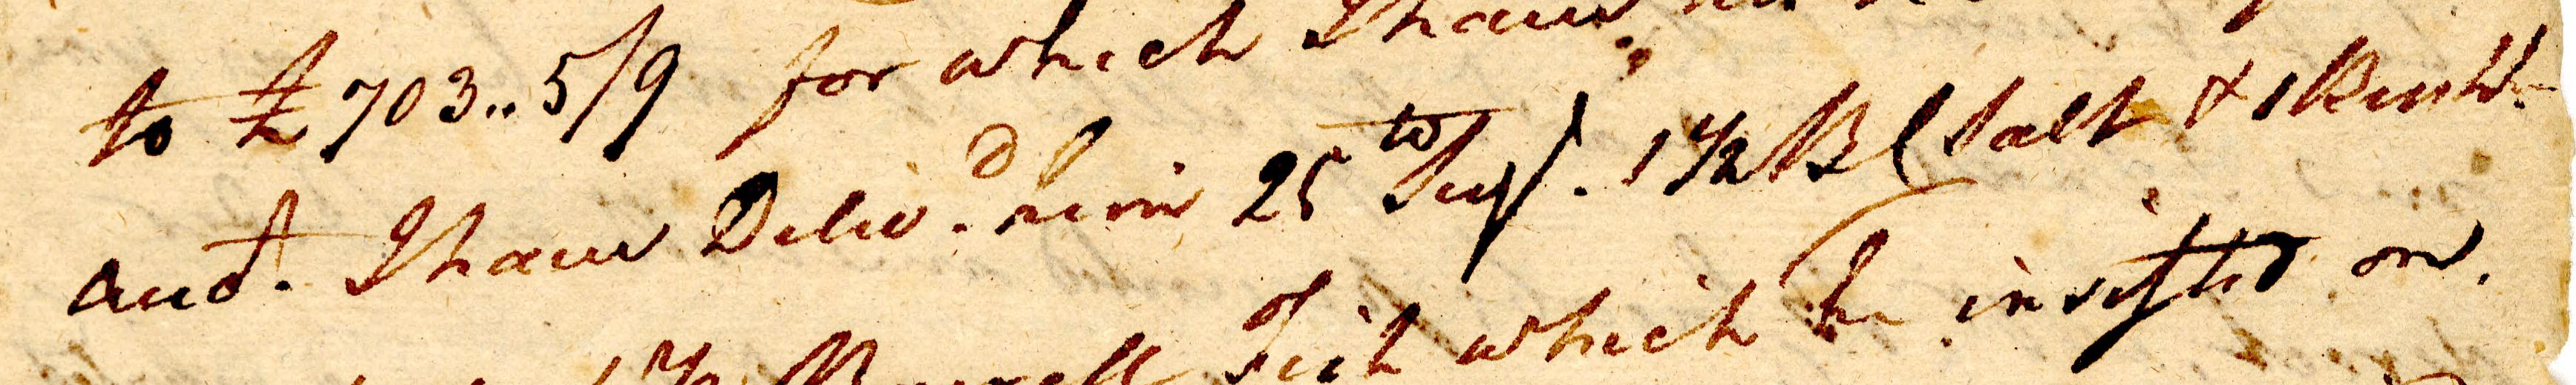aud^t. I have Deliv^d. him 25 ^lb Sug^r. 1 1/2 lb Cloth & 1 Burell
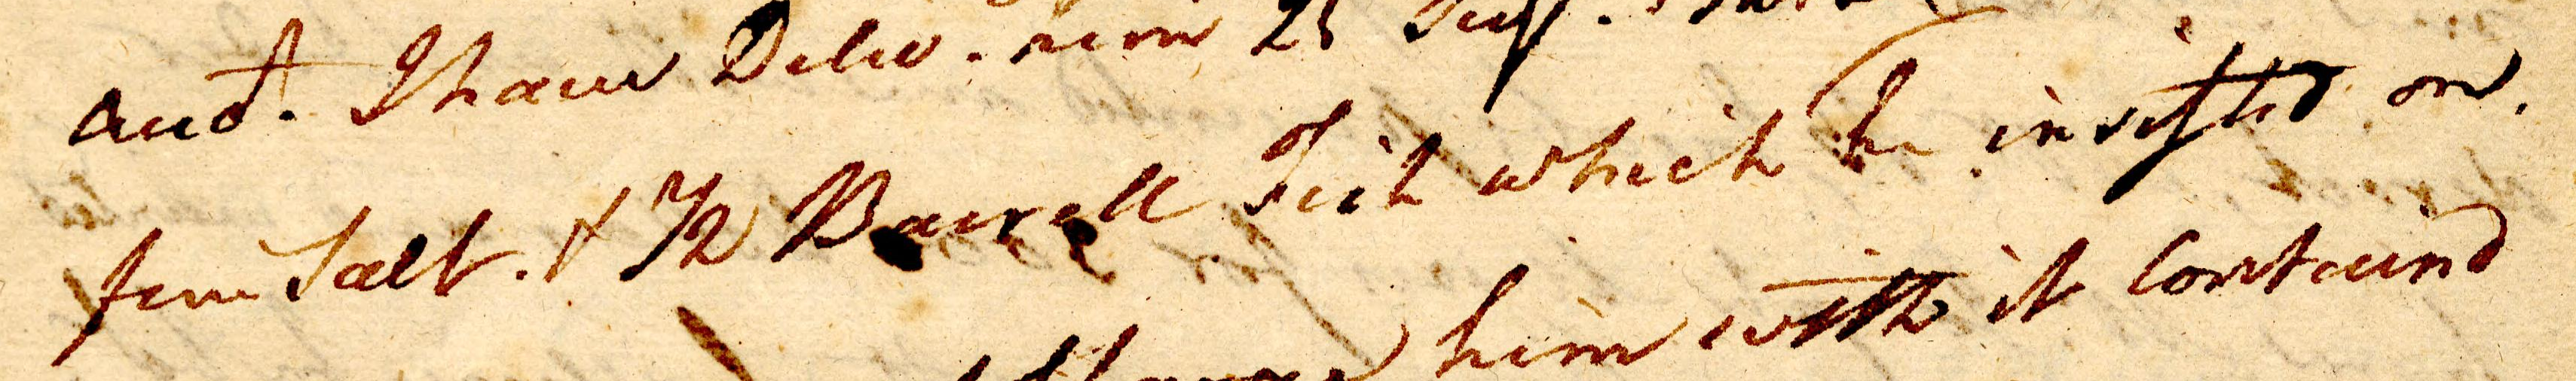for salt & y2 Barrell Fish which he insist'd on
